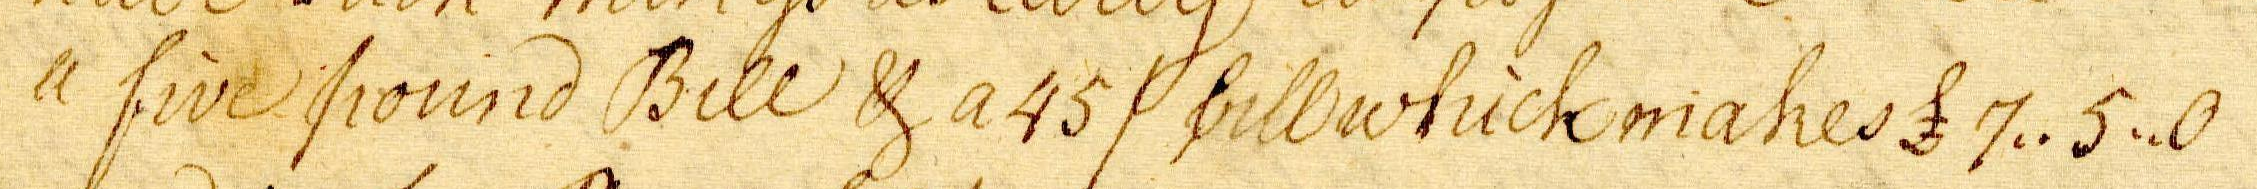a five pound Bill & a 45 / bill which makes £7..5..0
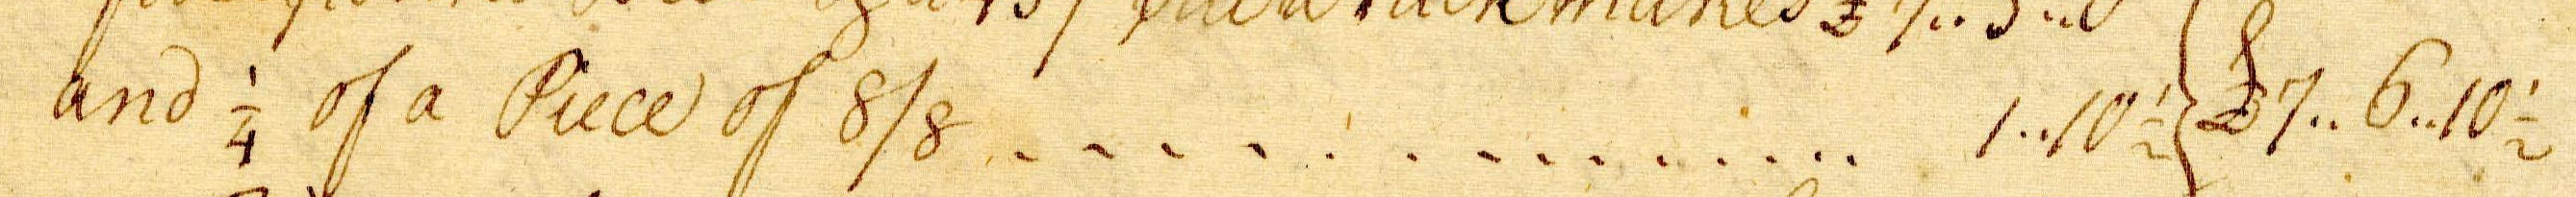and 1/4 of a Piece of 8/8..............1.10 1/2 } £7..6..10 1/2
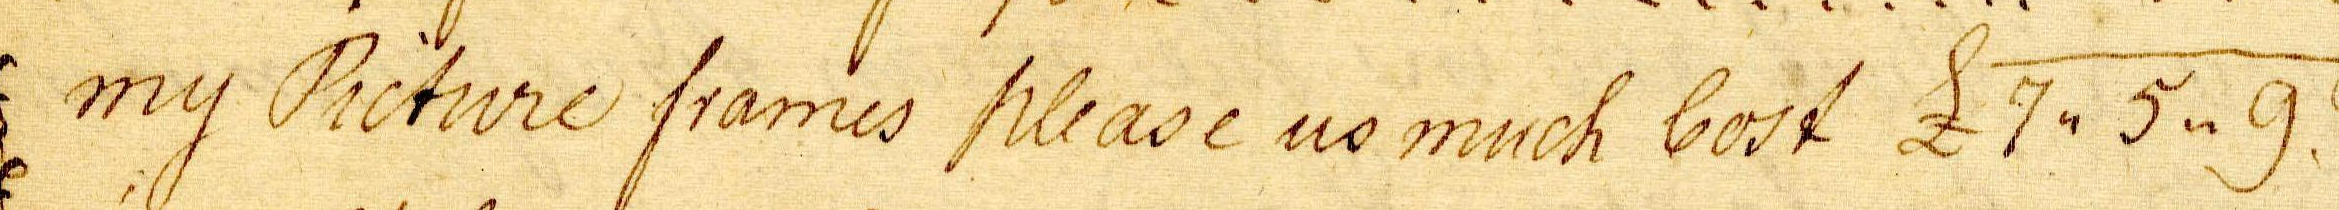my Picture frames please us much Cost £77..5..9.
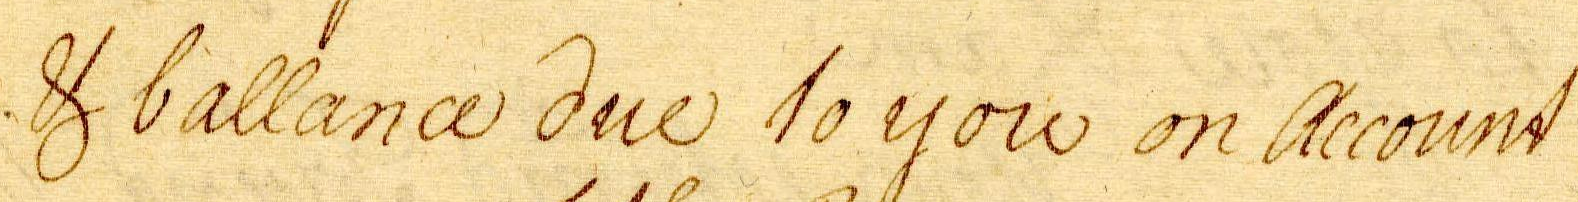& ballance due to you on Account
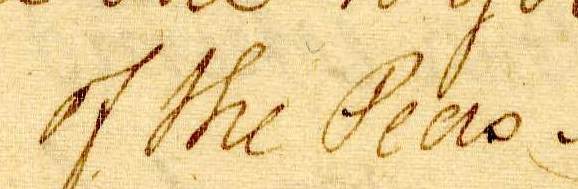of the Peas
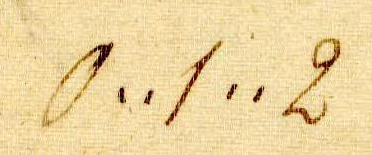0..1..2
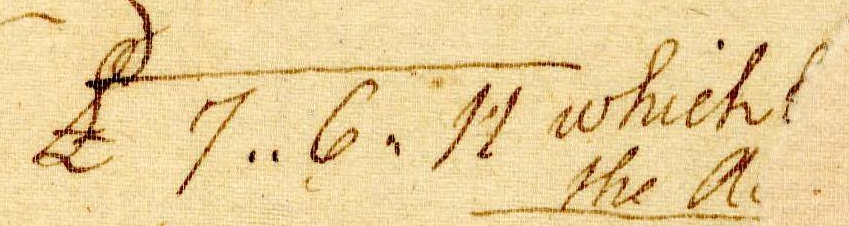£ 7.. 6.. 11 which
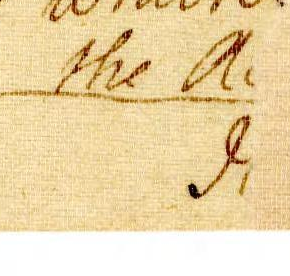the A
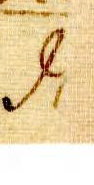I,
